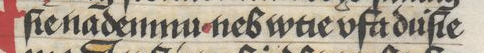ſie nademnu.neb wtie vſa duẛie
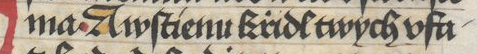ma.A wſtíenu kṙidl twych vſa¬
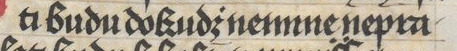ti budu dokudż nemine nepra¬
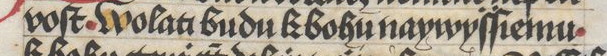voſt.Wolati budu k bohu naywyẛẛiemu.
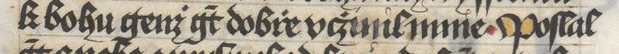k bohu genż ḡt dobṙe vcżinil mnie.Poſlal
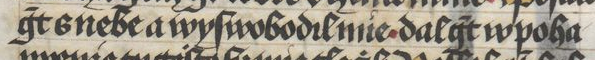ḡt s nebe a wyſwobodil mie.dal ḡt wpoha¬
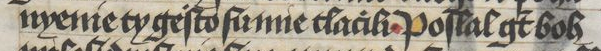nyenie ty geẛto ſu mie tlaċili.Poſlal ḡt boh
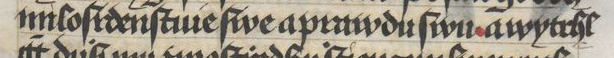miloſrdenſtuíe ſwe a prawdu ſwu.a wytrhl
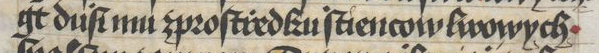ḡt duẛi mu zproſtṙedku ẛtiencow lwowych.
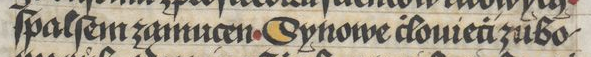ſpalſem zamucen.Synowe ċlouieċí zubo¬
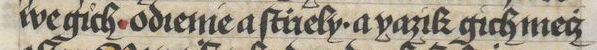we gich.odieníe a ſtṙiely.a yazik gich mecż
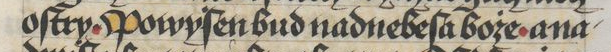oſtry.Powyẛen bud nadnebeſa boże.a na¬
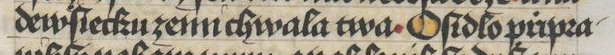dewẛiecku zemi chwala twa.Oſidlo pṙipra¬
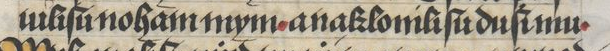uiliſu noham mym.a nakloniliſu duẛi mu.
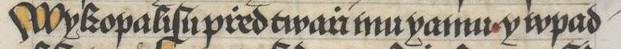Wykopaliſu pṙed twaṙí mu yamu.y wpad¬
